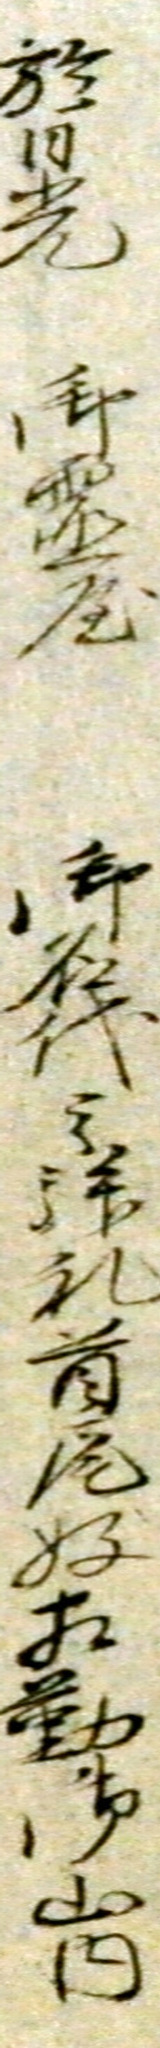於日光御霊屋御名代之拝礼首尾好相勤御山内
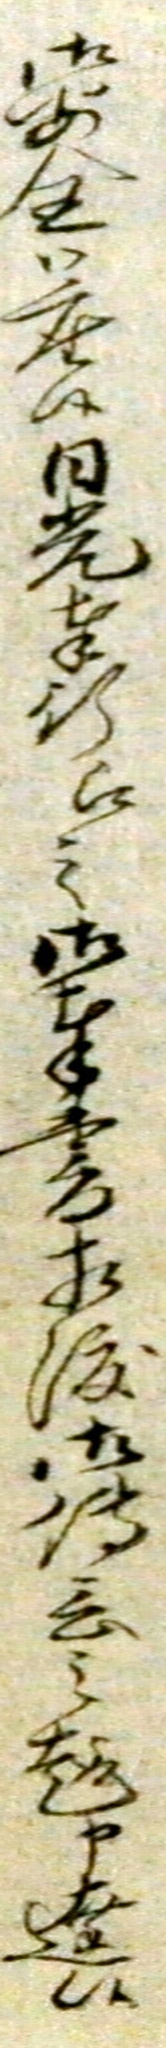御安全ご座候日光奉行江之御奉書相渡御伝言之趣申達候
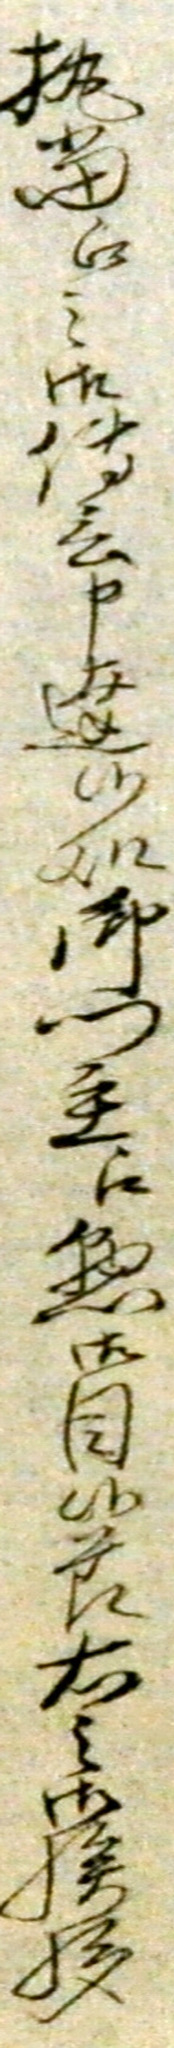執當江之御申達候処御門主江懸御目候節右之御挨拶

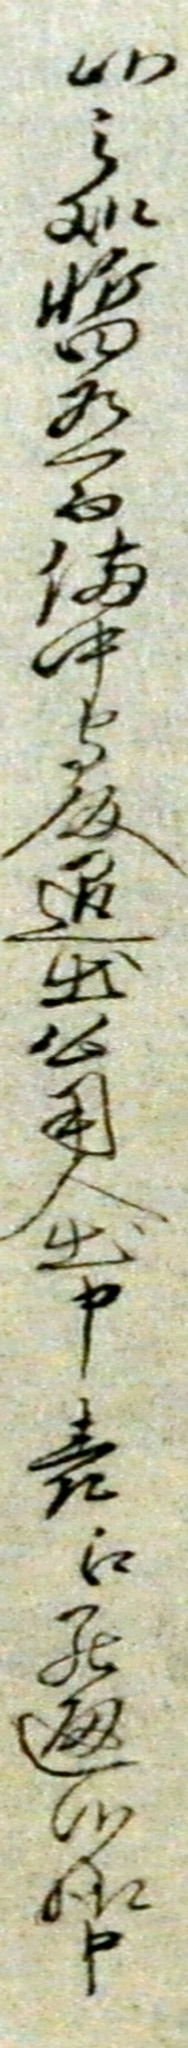候之処暫有而備中守殿退出公用人出申表江罷通候様申
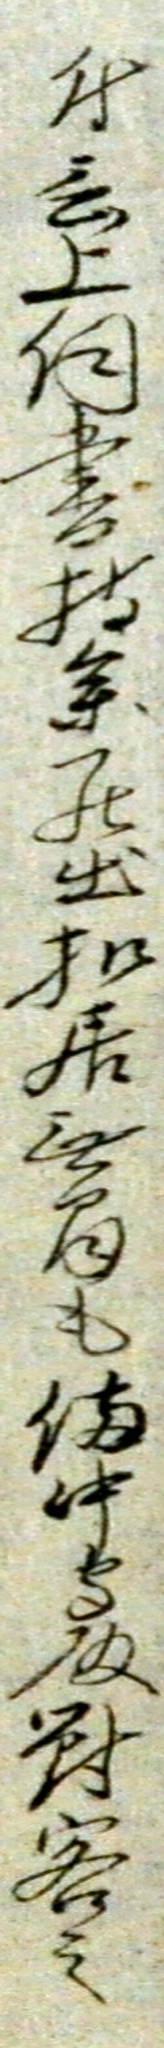付言上伺書持参罷出控居無間も備中守殿対客之
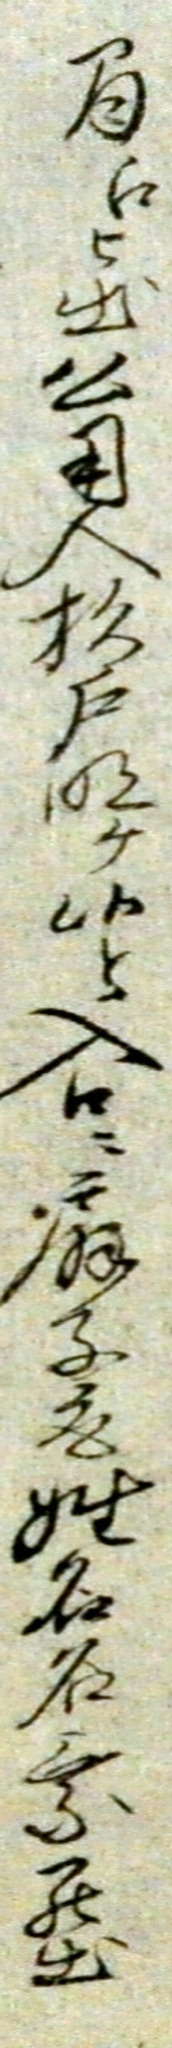間江ヒ出公用人杉戸明ケ候と入口ニ扇子取姓名名乗罷出
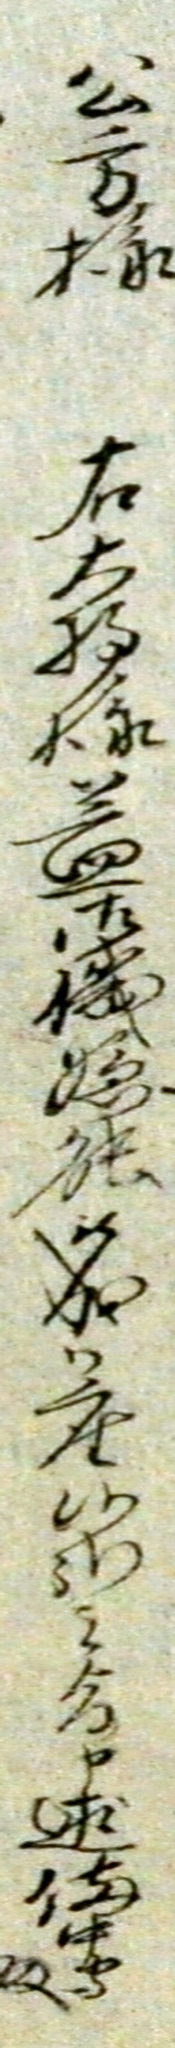公方様右大将様益御機嫌能被成ご座候哉之旨申述守殿
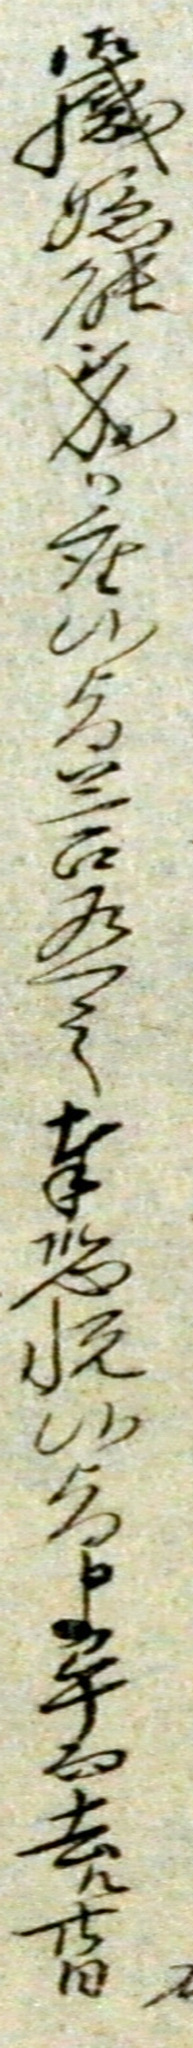御機嫌能被成ご座候旨答有之奉恐悦候旨申畢而去廿日
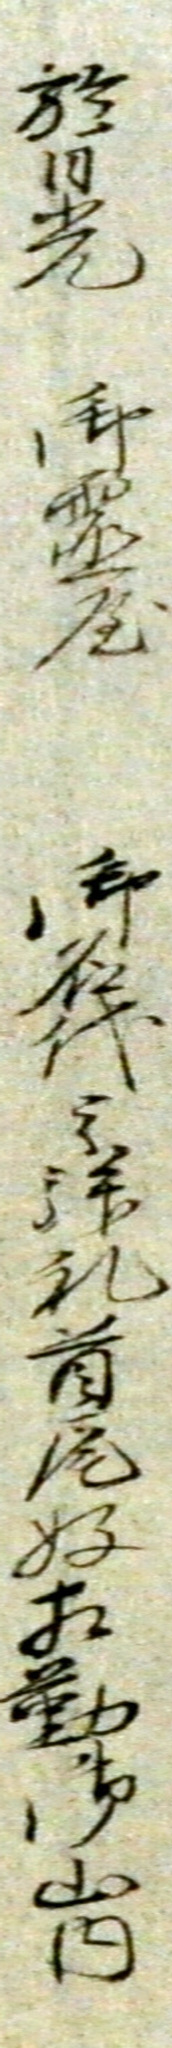於日光御霊屋御名代之拝礼首尾好相勤御山内
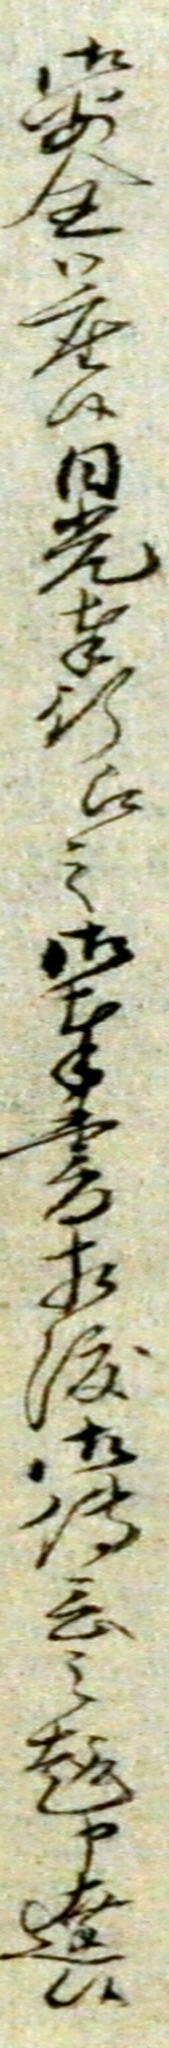御安全御座候日光奉行江之御奉書相渡御伝言之趣申達候
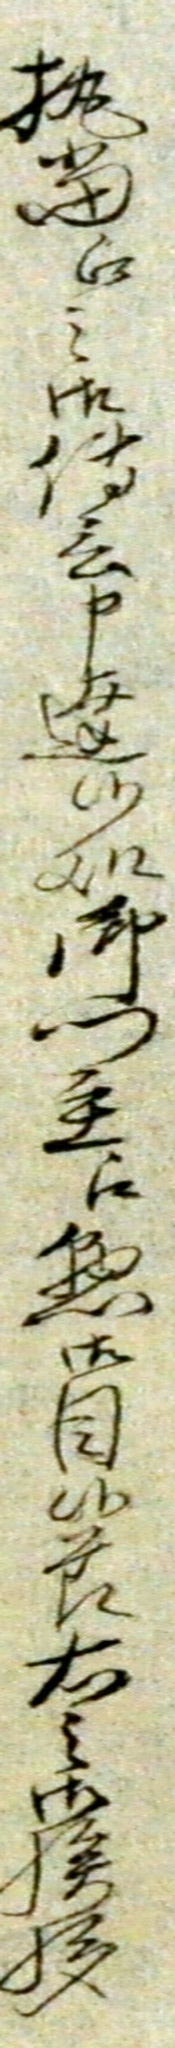執當江之御伝言申達候処御門主江懸御目候節右之御挨拶
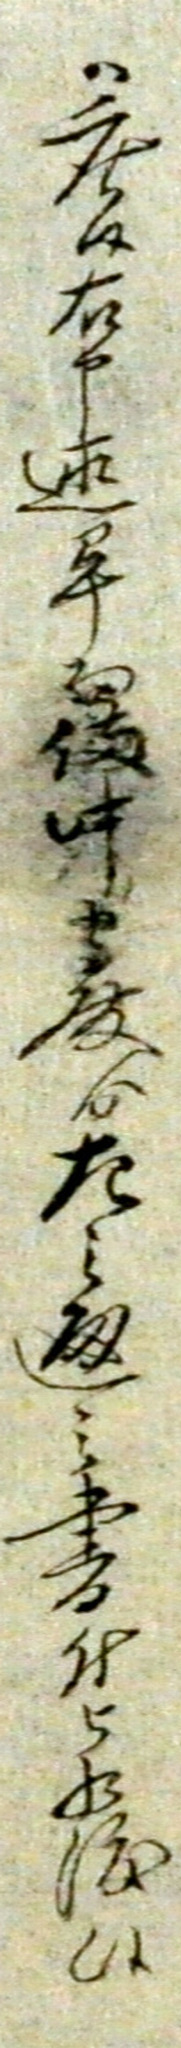御座候右申述畢而備中守殿ゟ左之通之書付ヒ相渡候
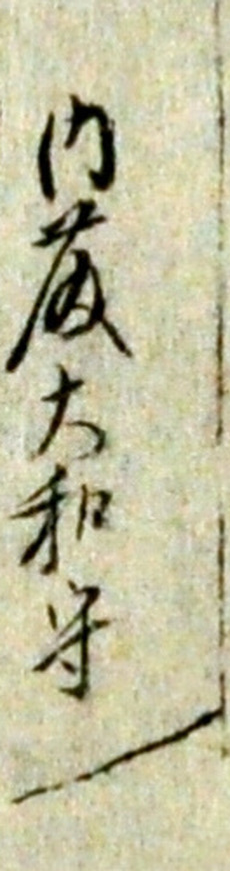内藤大和守
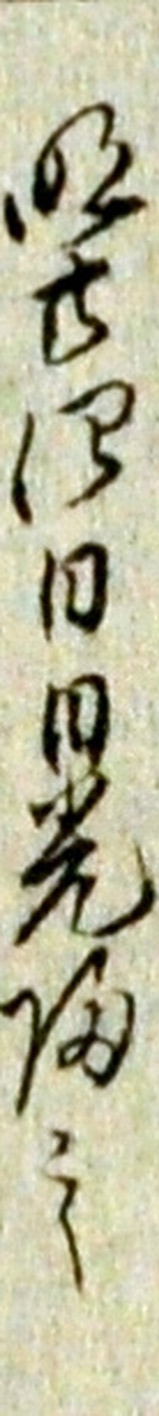明廿四日日光帰之
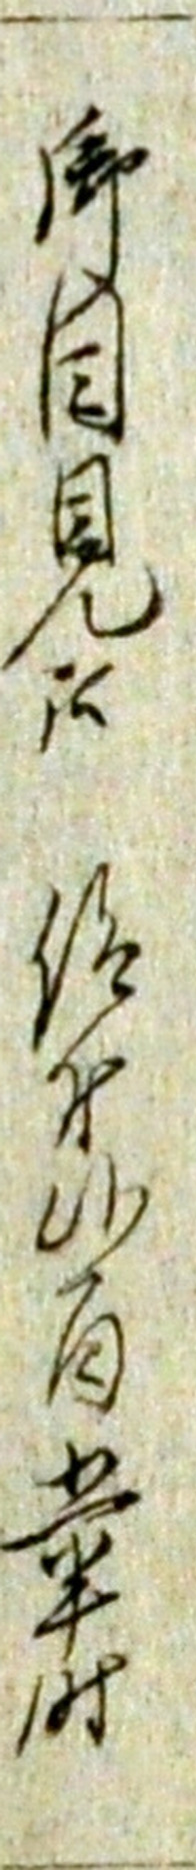御目見江仰付候間五半時
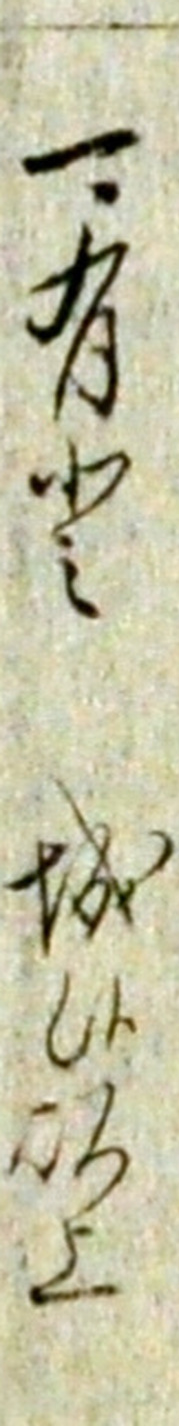可有登城候以上
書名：日光御名代相勤候節ノ留
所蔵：伊那市立高遠町図書館・合同会社AMANE
